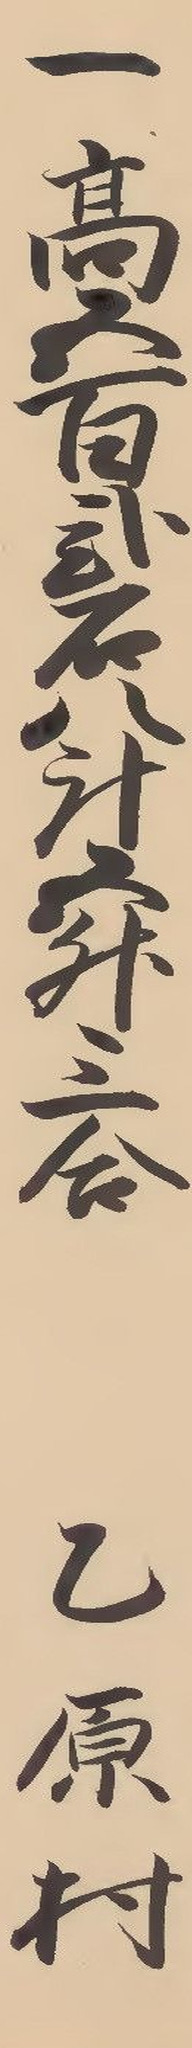一高五百弐石八斗五升三合乙原村
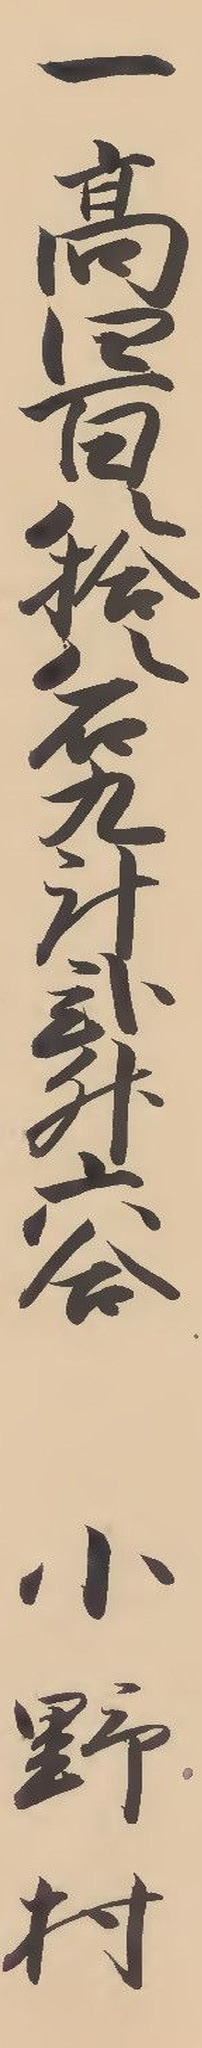一高四百八拾八石九斗弐升六合小野村
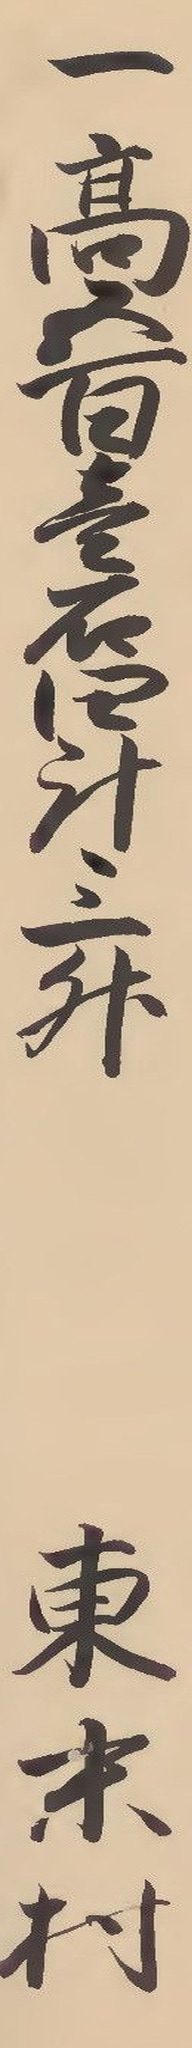一高五百壱石四斗三升東末村
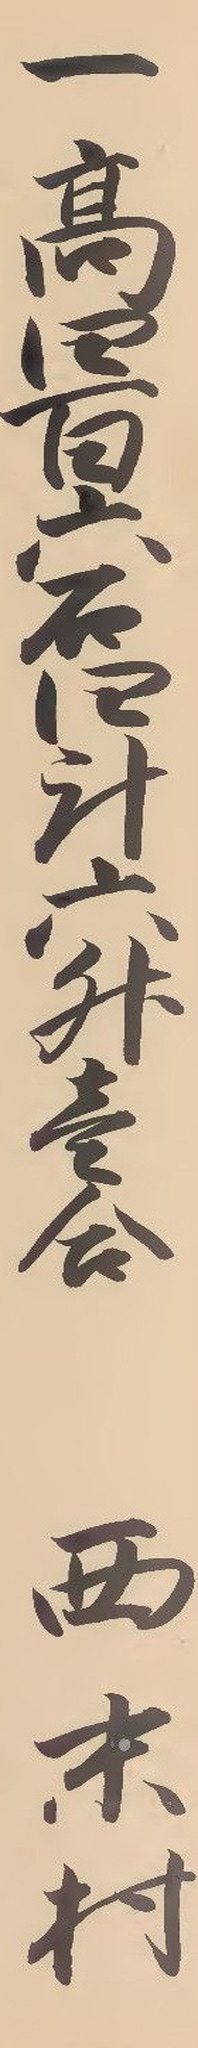一高四百六石四斗六升壱合西末村
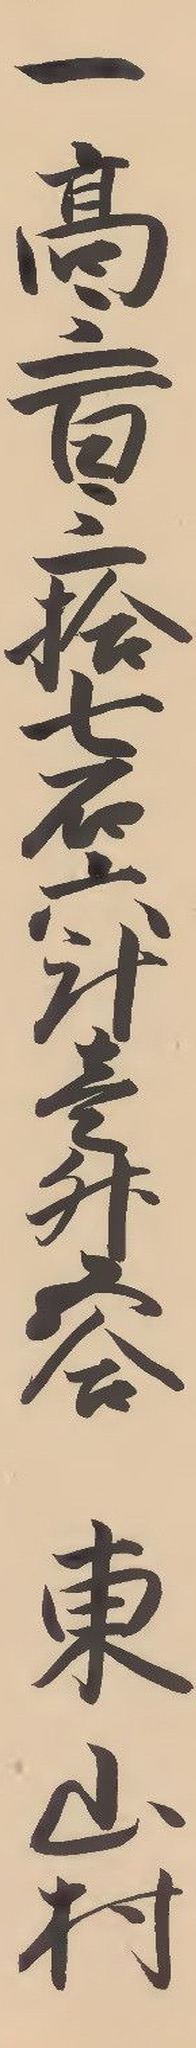一高三百三拾七石六斗壱升五合東山村
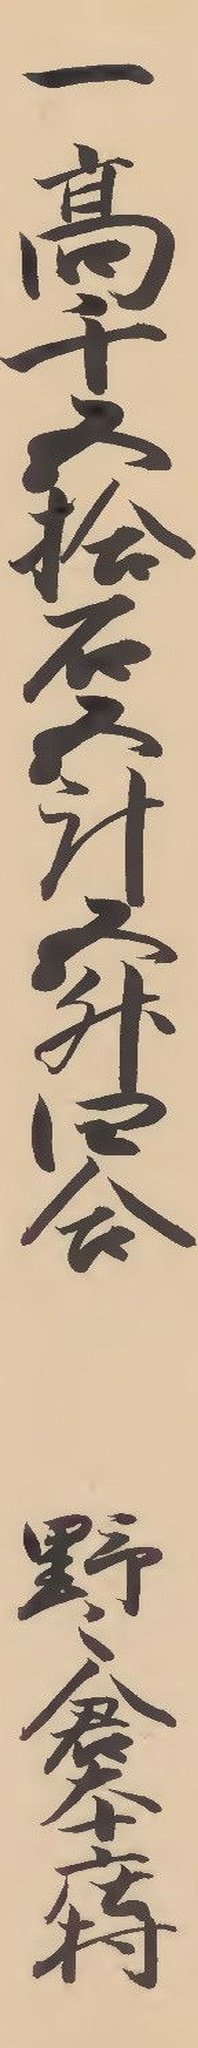一高千五拾石五斗五升四合野々倉本庄村
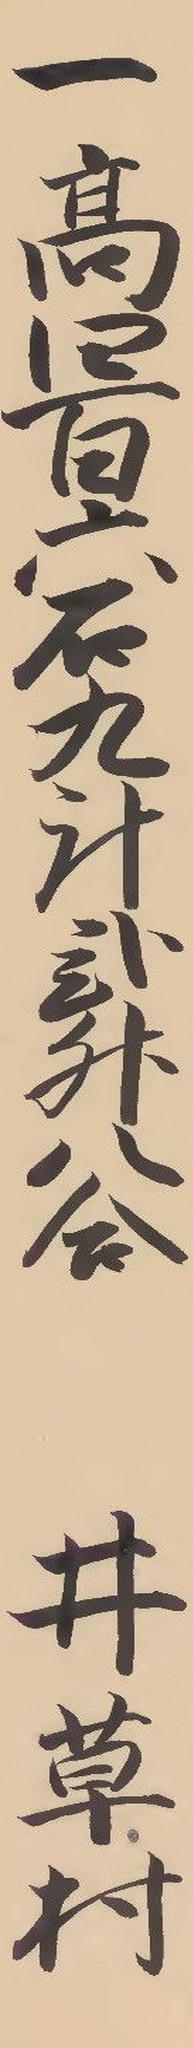一高四百六石九斗弐升八合井草村

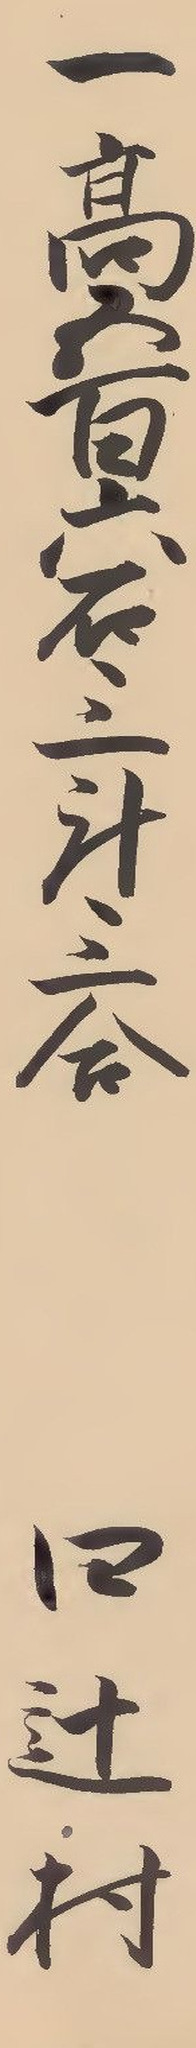一高五百六石三斗三合四辻村
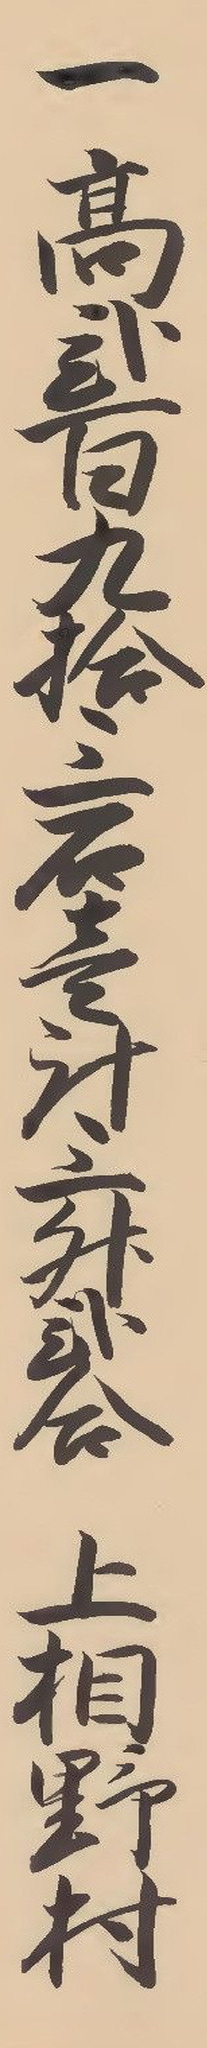一高弐百九拾三石壱斗三升弐合上相野村
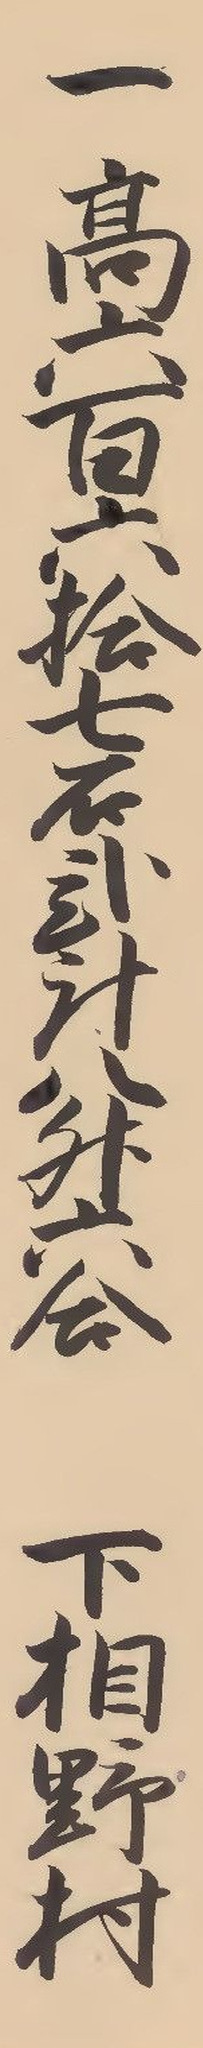一高六百六拾七石弐斗八升六合下相野村
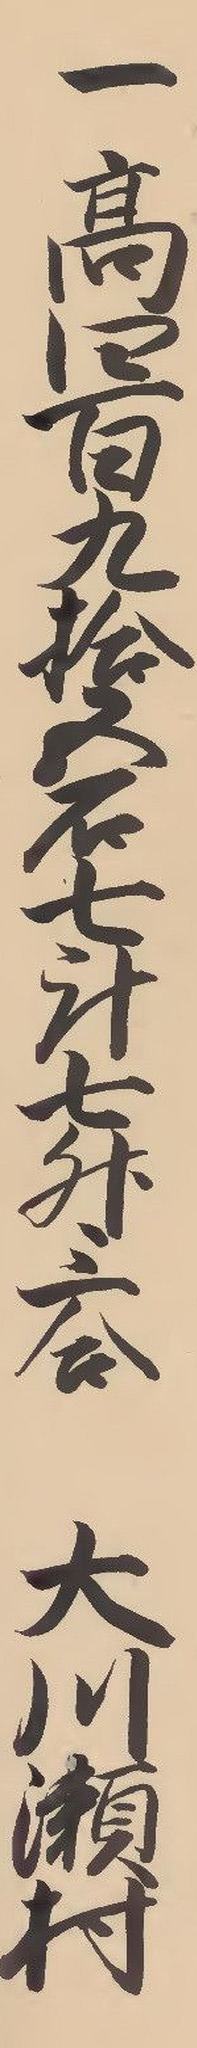一高四百九拾五石七斗七升六合大川瀬村
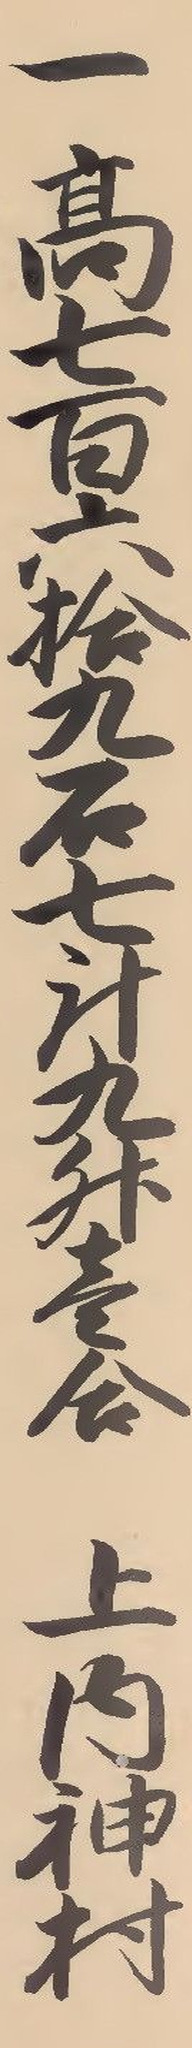一高七百六拾九石七斗九升壱合上内神村
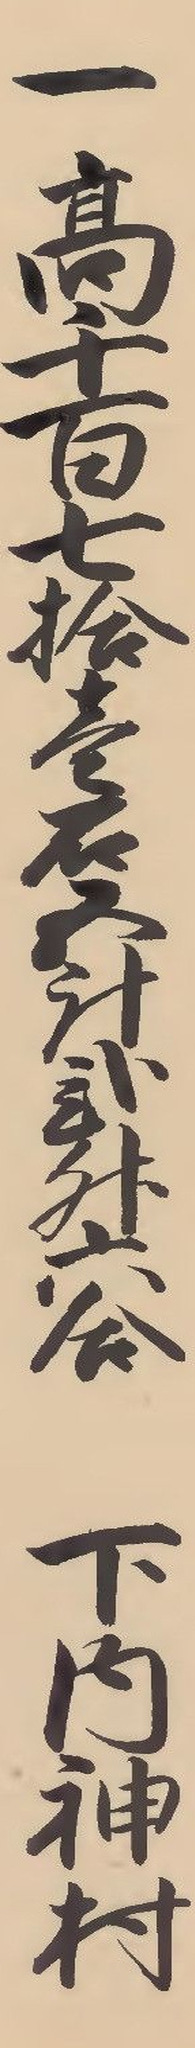一高千百七拾壱石五斗弐升六合下内神村
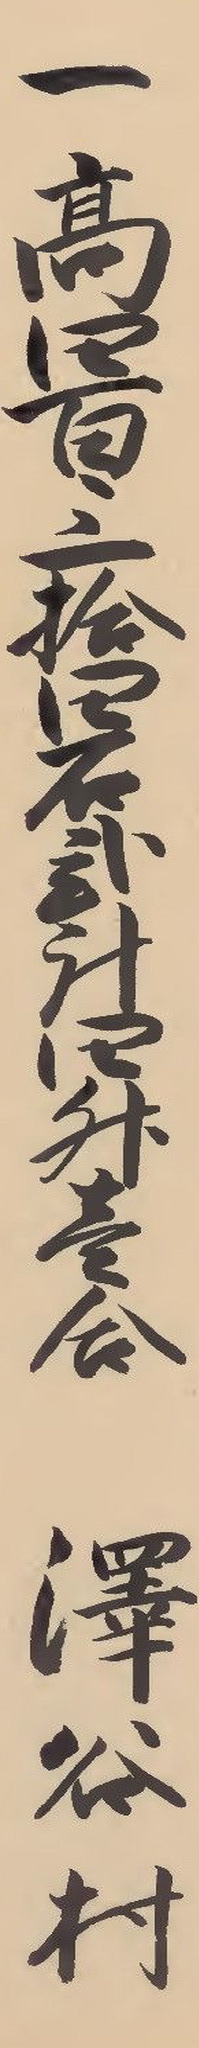一高四百三拾四石弐斗四升壱合沢谷村
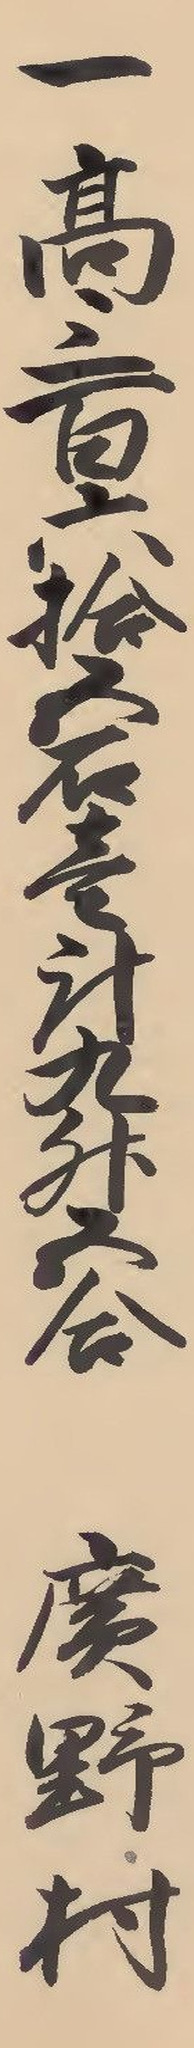一高三百六拾五石壱斗九升五合広野村

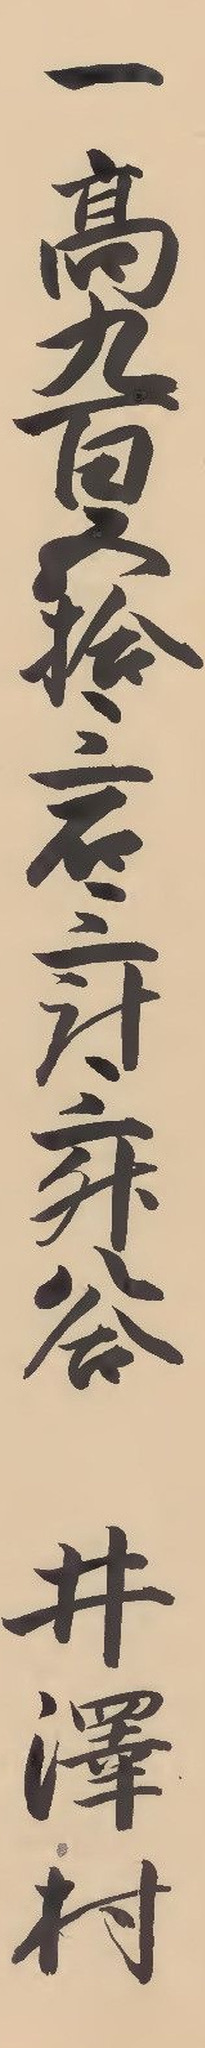一高九百五拾三石三斗三升八合井沢村
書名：摂津国郷帳
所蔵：国立公文書館 National Archives of Japan
